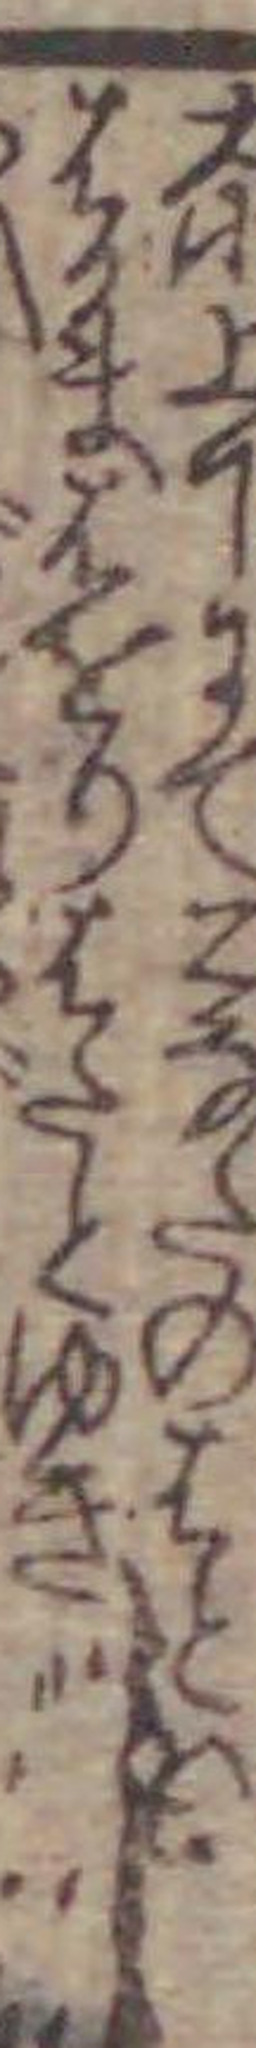はかまはをりはたとゆき
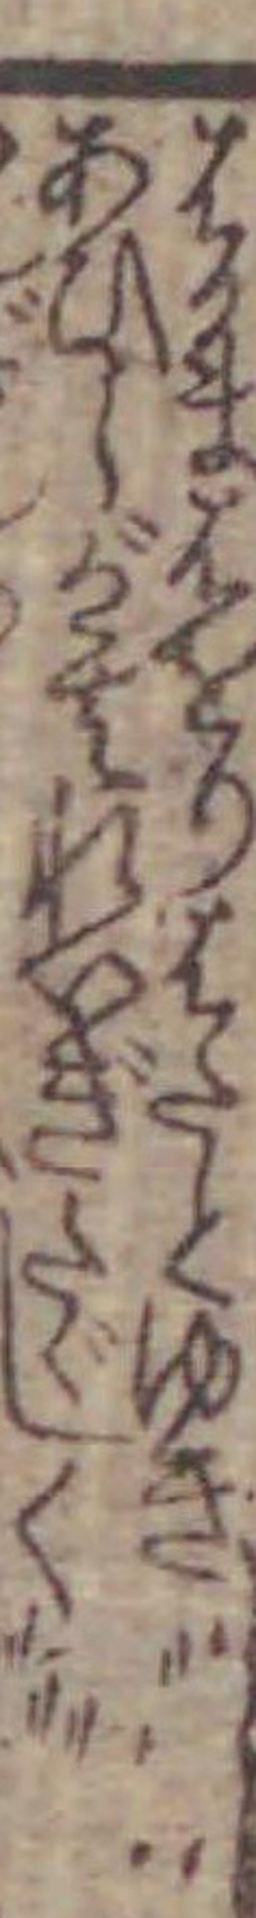あひしが其れいぎたゞしく
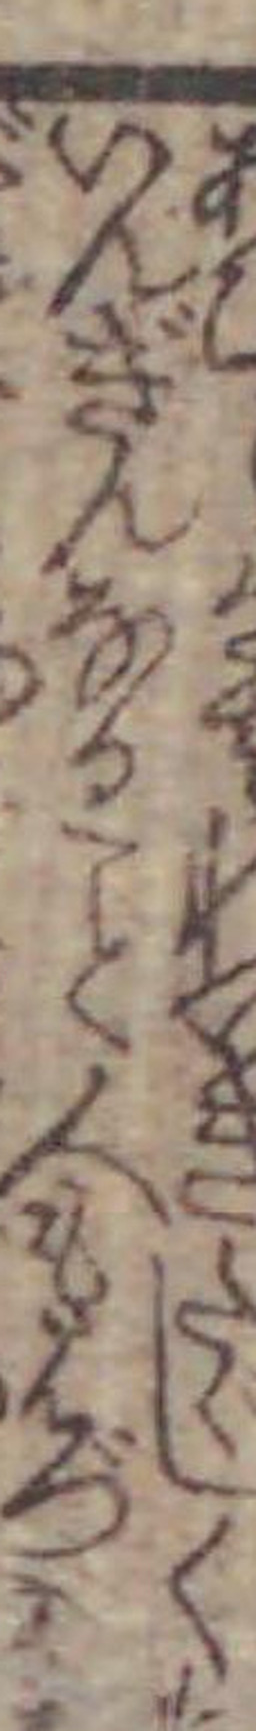いんぎんなること人もはづ
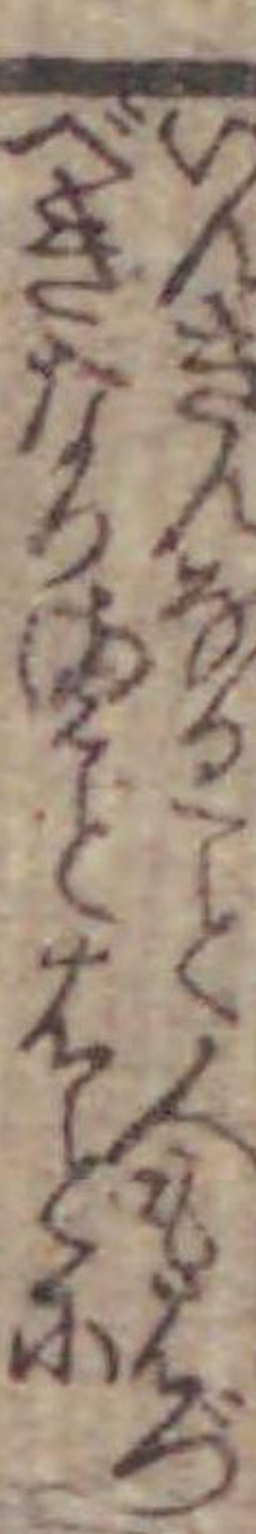べきなるまことはとに
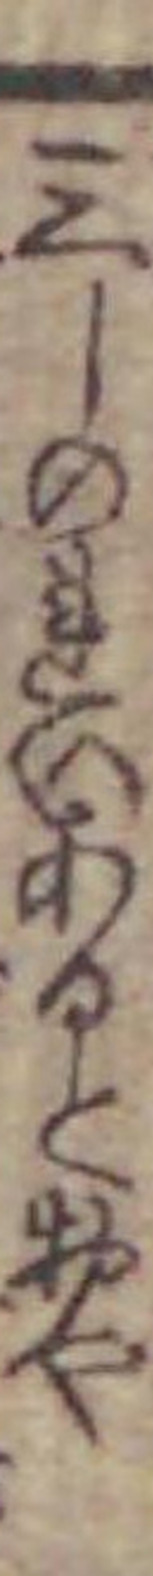三しのれいあるとおや
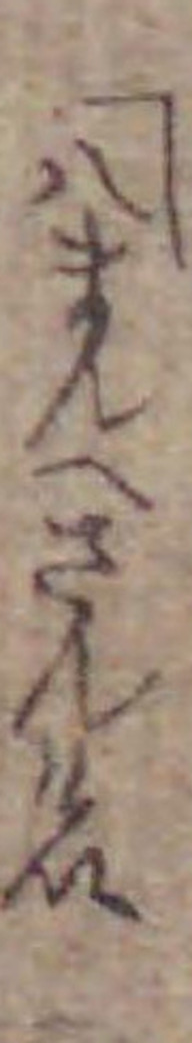〽八まんへさんけい
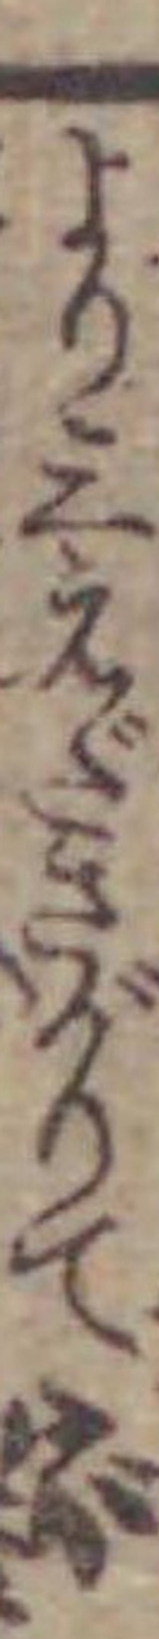より三えださがりて
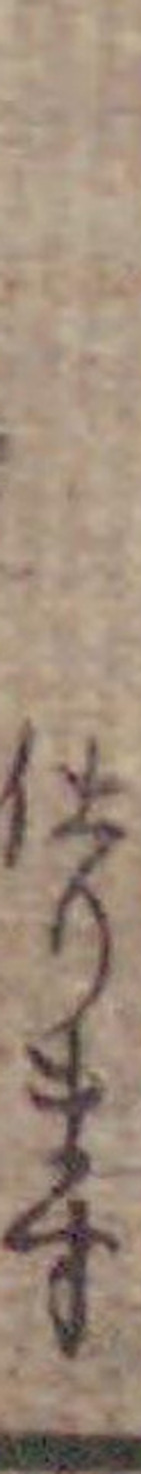仕ります
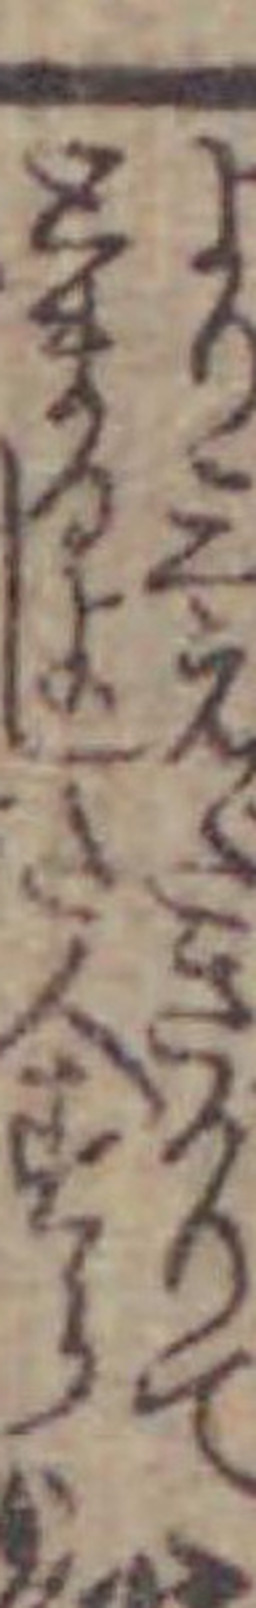とまるよした人すら
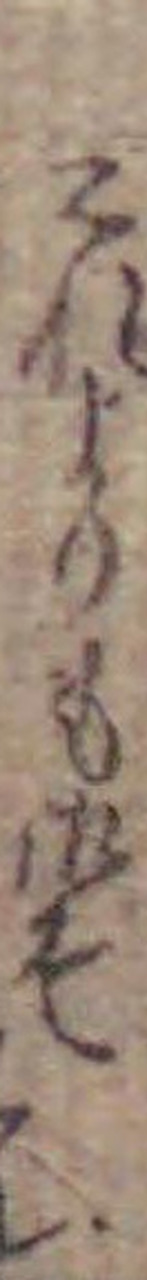これよりも御そ
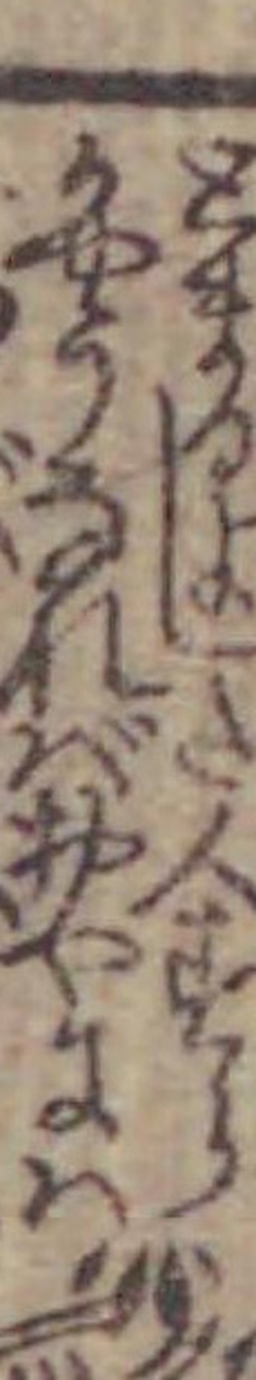かやうなればおやには
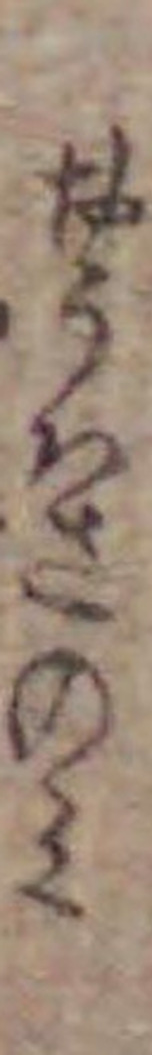おうはさのみ
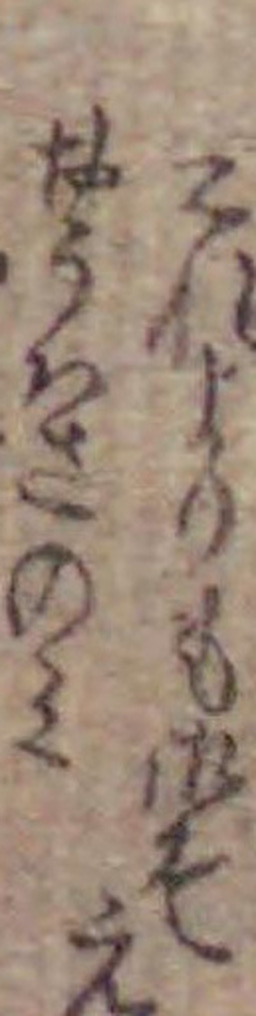おうはさのみ
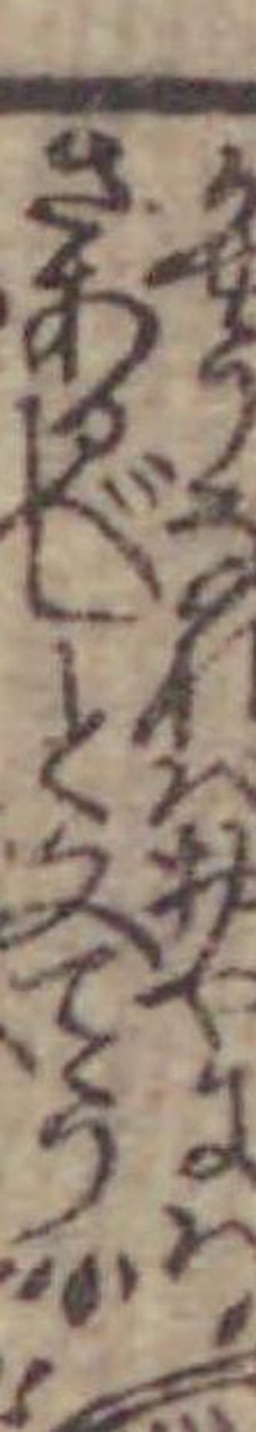さあるべしと又てう
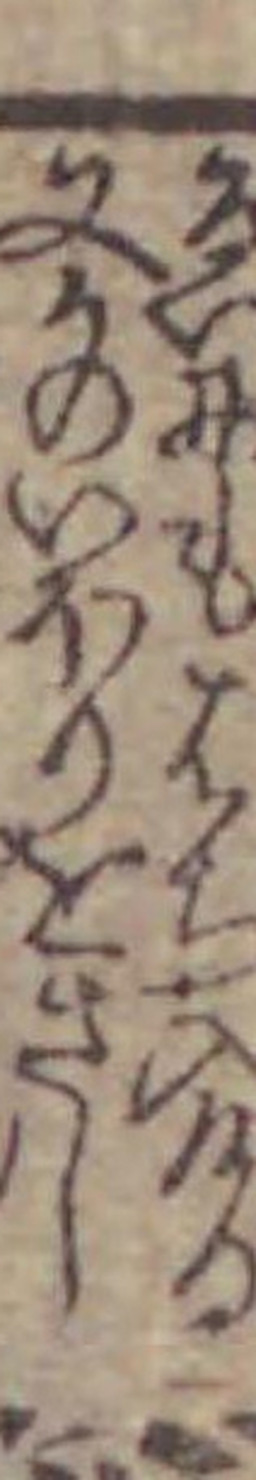又かのいほりをさし
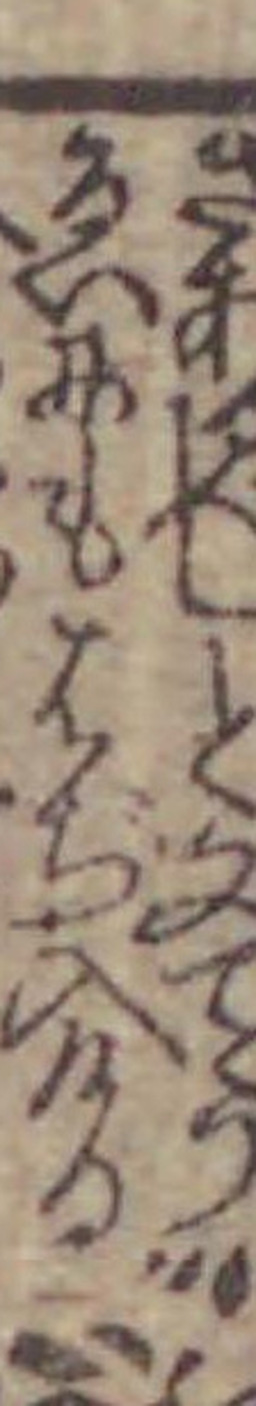るいにもはぢ入ける
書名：即席耳学問 : 3巻
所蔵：国立国会図書館 National Diet Library, JAPAN
